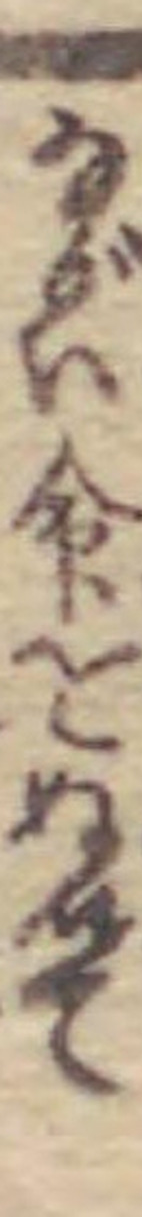ながい命をぬいて
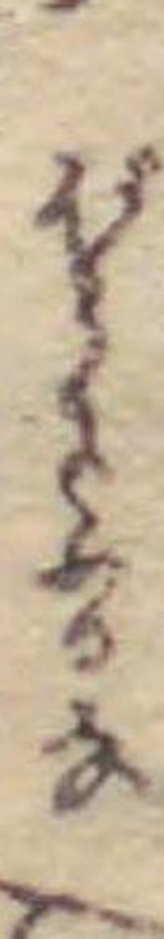ぼうにふるな
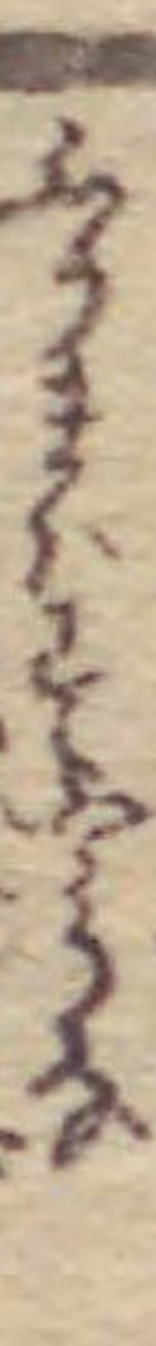ふりまはすやうな
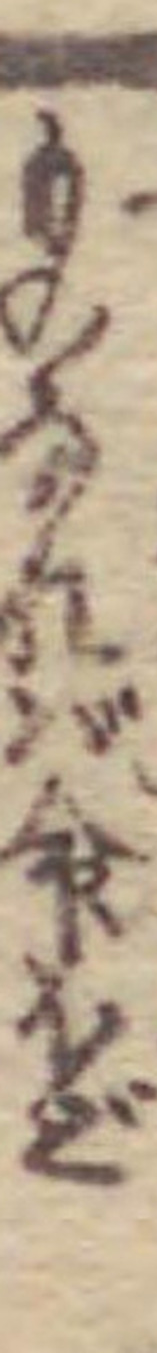ものなれば命ほど
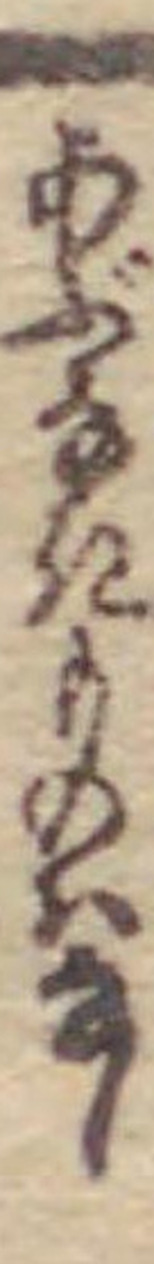あぶなきものはなし
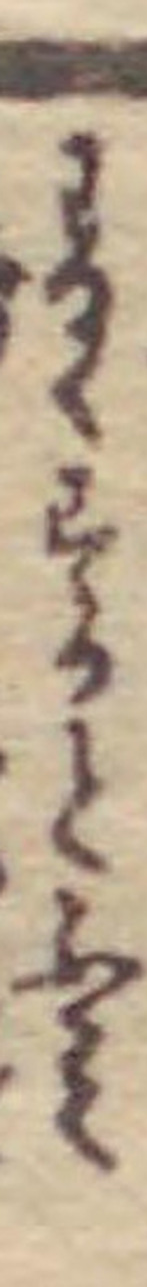わるくするとふみ
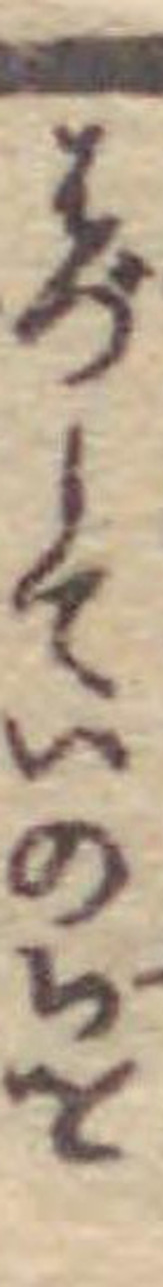はづしていのちを
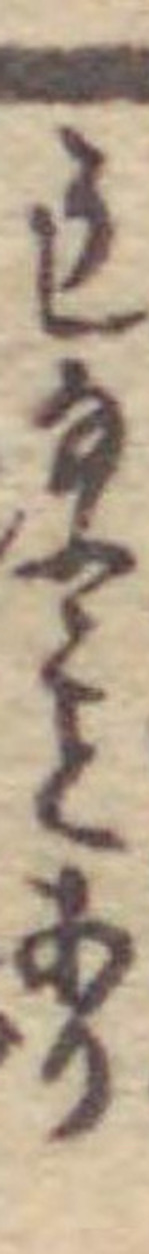うしなふことあり
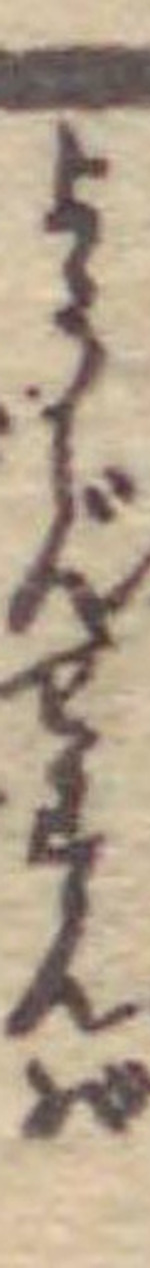ようじんせすんば
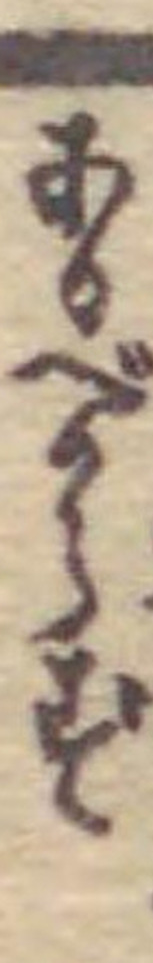あるべからず
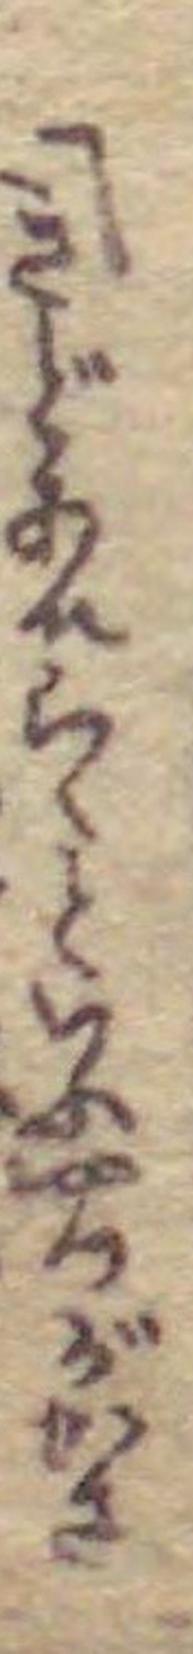〽きどあいらくといふやつがかさ
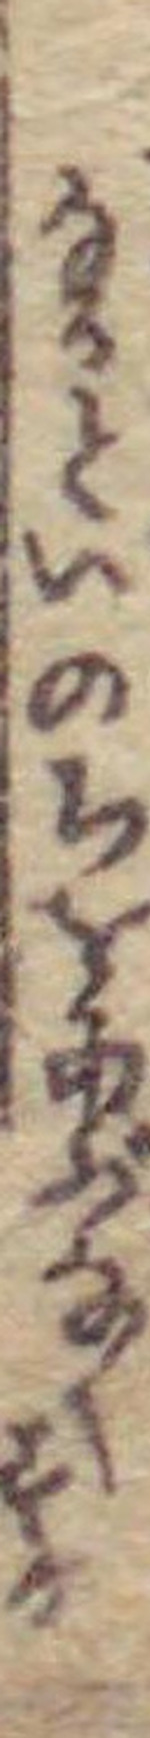なるといのちをあぶなくする
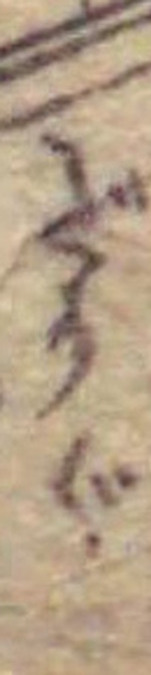だうぐ

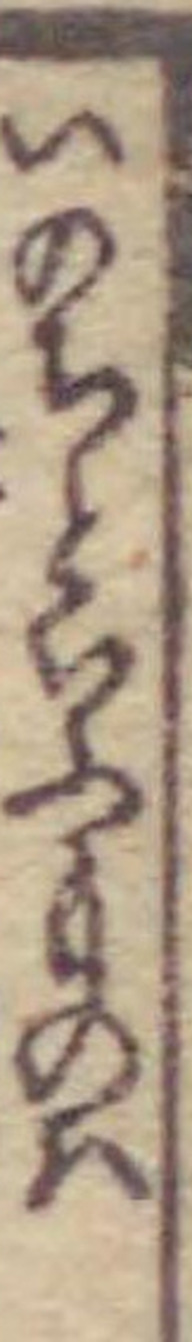いのちといふものは
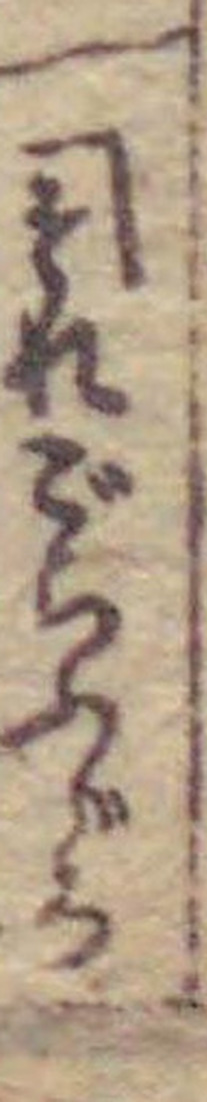〽それごらふがつ
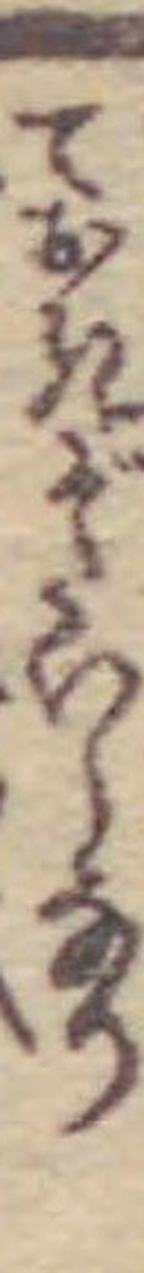ておきがたいしなり
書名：御誂染長寿小紋 : 3巻
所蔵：国立国会図書館 National Diet Library, JAPAN
